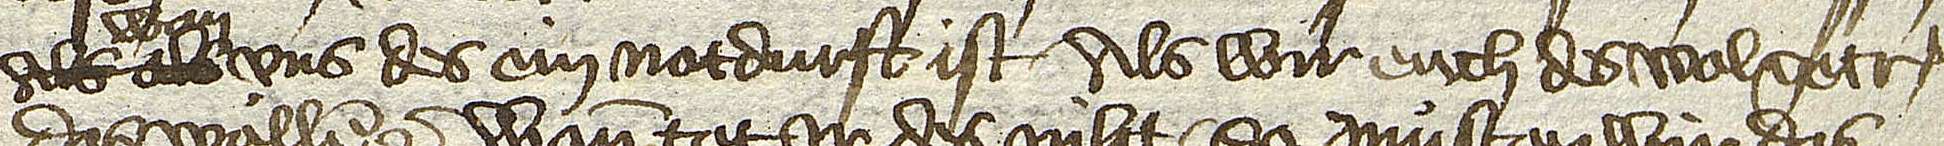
Als als vns des ein notdurft iſt / Als wir euch des wol getr*
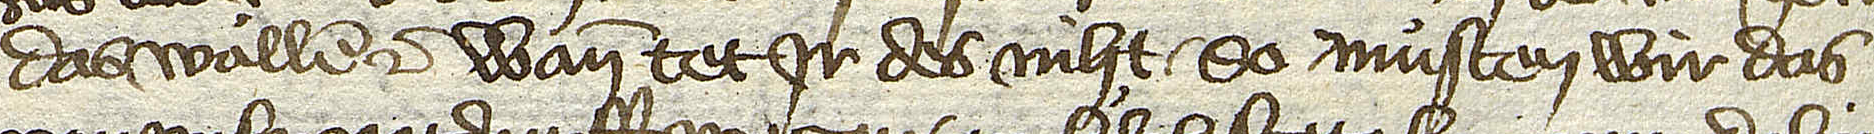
das wölle* ec* Wan* tet Ir des niht / So müſten wir das
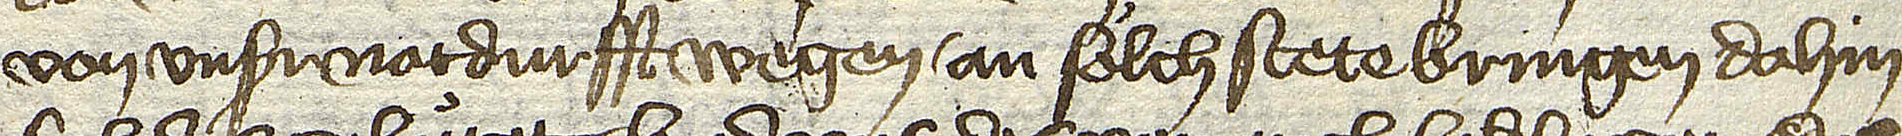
von vnſ*r notdurfft wegen / an ſölch ſtete bringen dahin
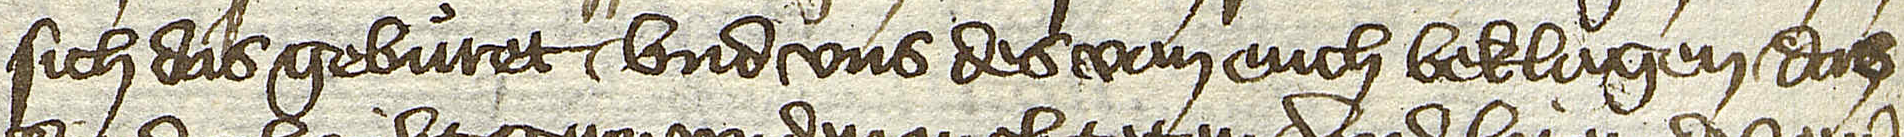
ſich das gebüret / vnd vns des von euch beklagen / das
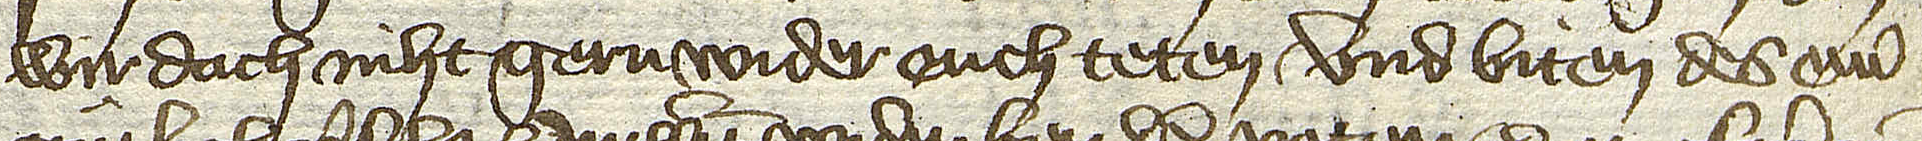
wir doch niht gern wider euch teten / Vnd biten des ew*
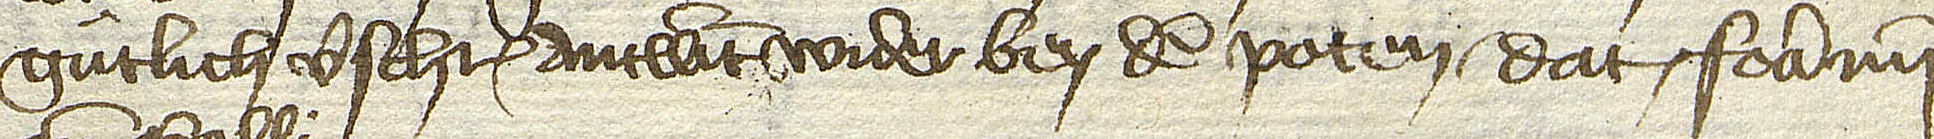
gütlich v*ſchr* Antw*rt wider bey d* poten / dat* fea* iiii*
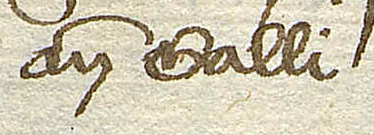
an* Galli
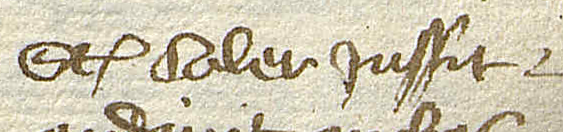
St* Coler Iuſſit @
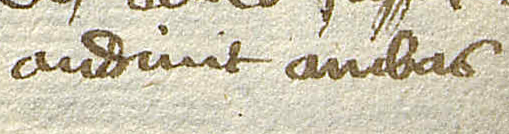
audiuit ambas
